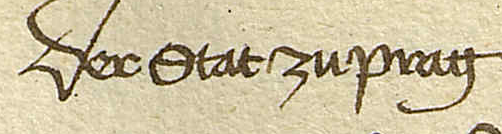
Der Stat cʒu Prag
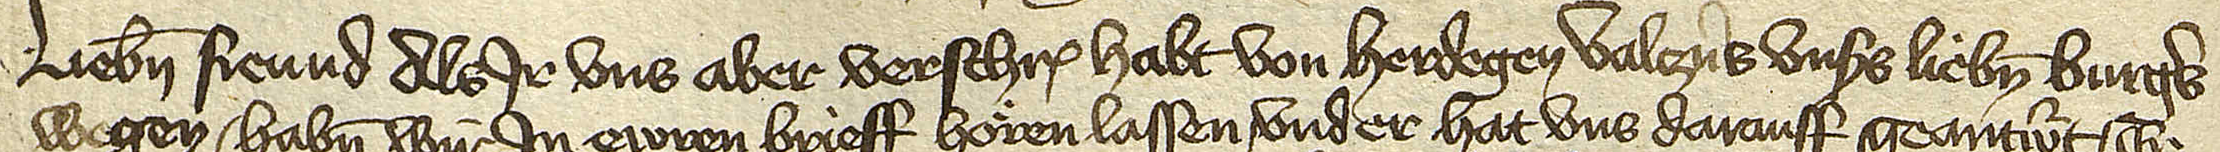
Liebn* freund Als Ir vns aber verſchr* habt von herdegen Valcʒn*s vnſ*s liebn* burg*s
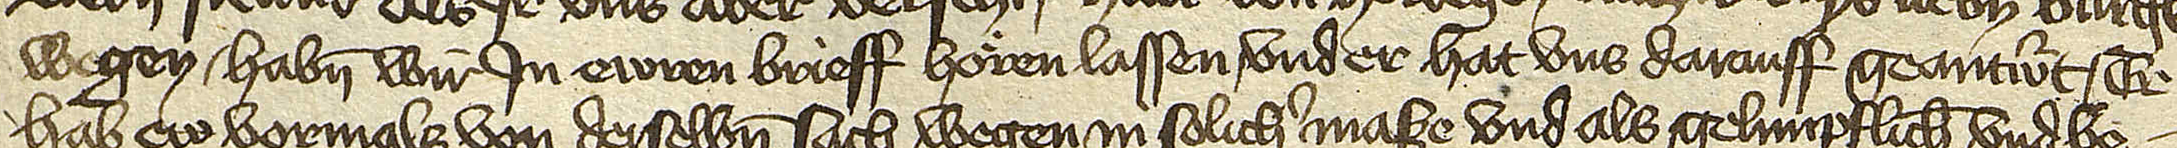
wegen / habn* wir In ewren brieff hören laſſen / vnd er hat vns darauff geantw*t / Er
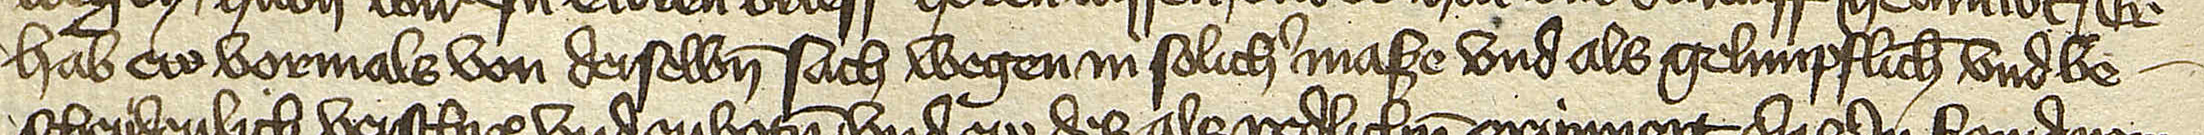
hab ew vormals von derſelbn* ſach wegen in ſolich* maſʒe vnd als gelimpflich* vnd be -
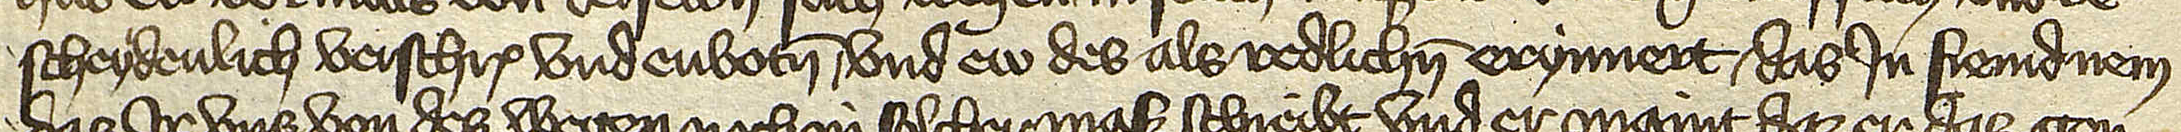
ſcheydenlich verſchr* vnd enbotn* / vnd ew des als redlichn* erynnert / das In fremdnem
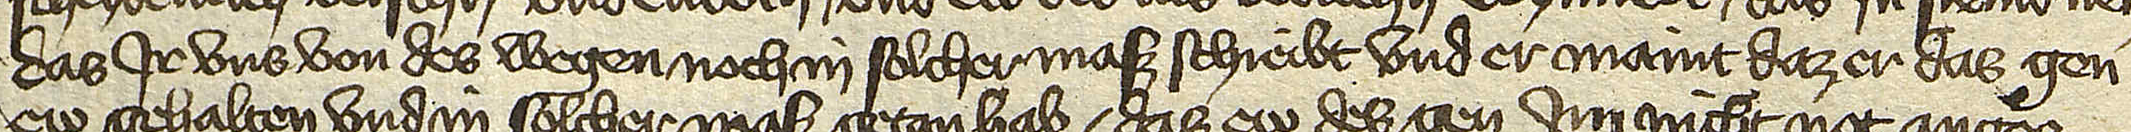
das Ir vns von des wegen noch in ſolcher maſʒ ſchreibt vnd er maint daʒ er das gen
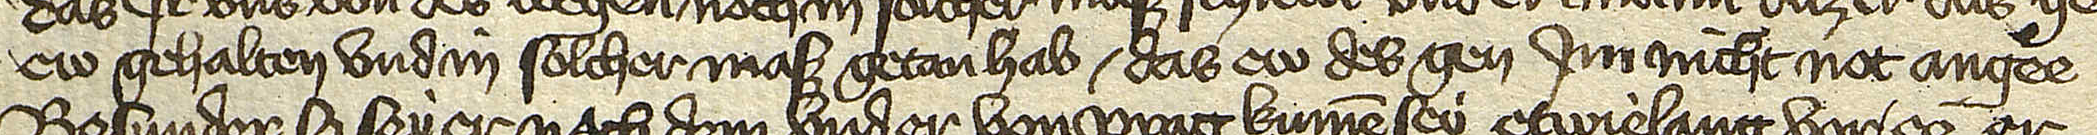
ew gehalten vnd in ſolcher maſʒ getan hab / das ew des gen Im nicht not angee
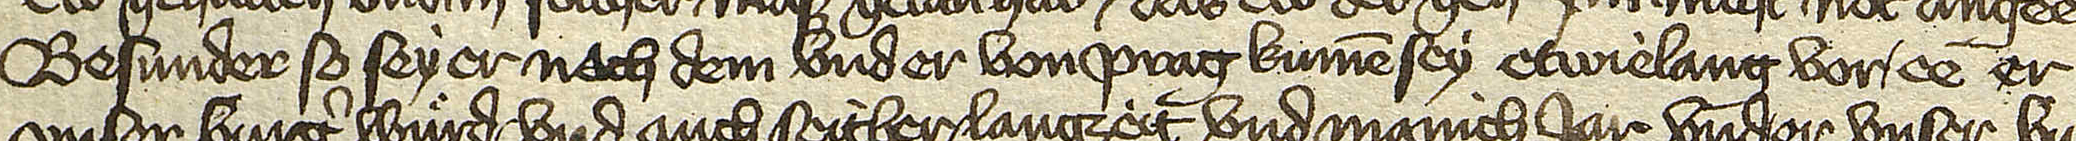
Beſunder ſo ſey er nach dem vnd er von Prag kume* ſey etwielang vor / ee er
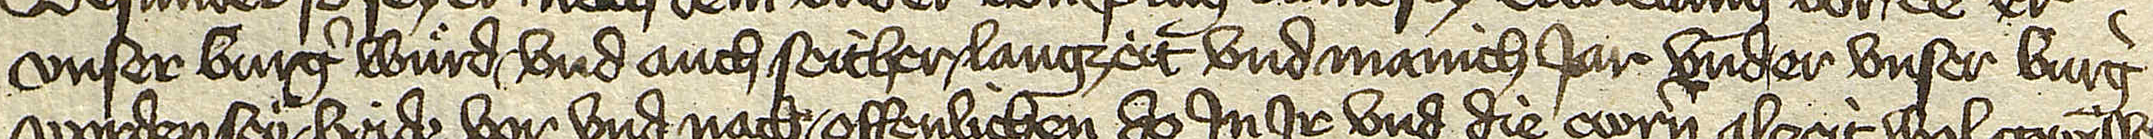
vnſer burg* würd / vnd auch ſeither langʒeit vnd manich Iar vnd / er vnſer burg*
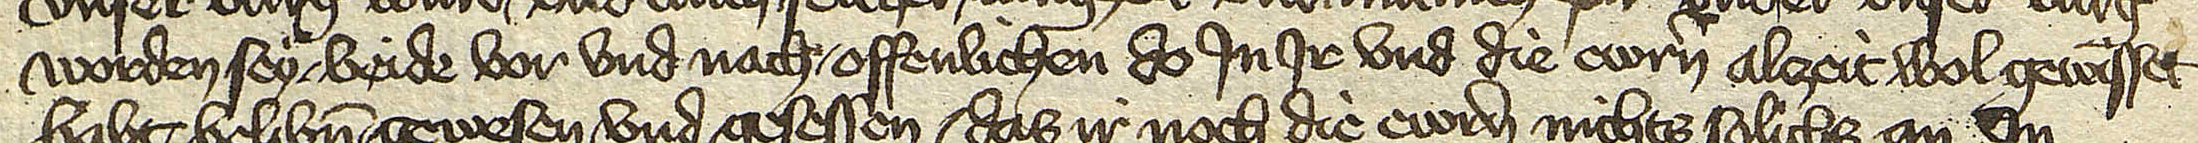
worden ſey / beide vor vnd nach / offenlichen do In Ir vnd die ewrn* alcʒeit wol gewiſſet
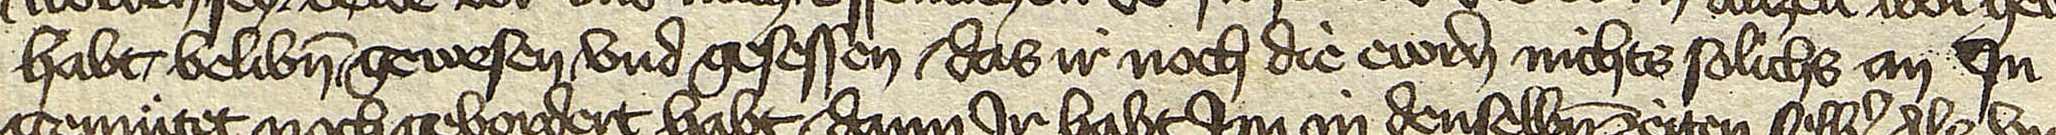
habt / belibn* geweſen / vnd geſeſſen / das ir noch die ewr*n nichts ſolichs an In
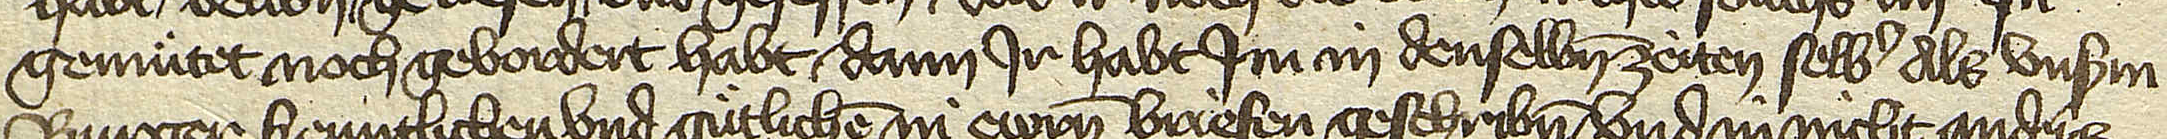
gemütet noch gevordert habt / dann Ir habt Im in denſelbn* ʒeiten ſelb* Als vnſ*m
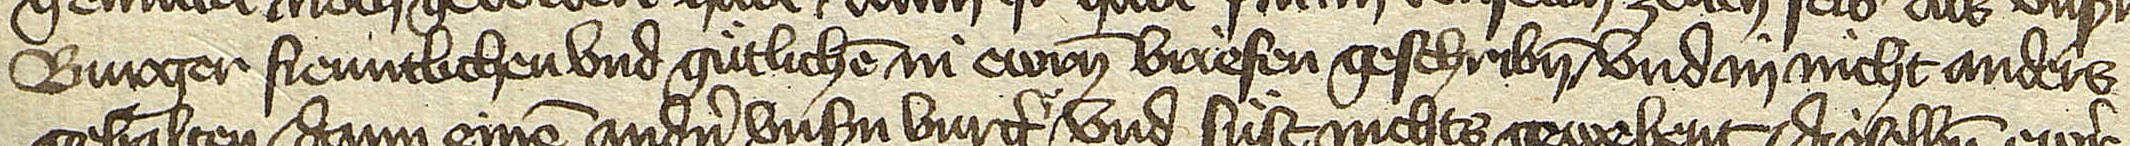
Burger freuntlichen vnd gütliche* ewrn* briefen geſchribn* / vnd in nicht anders
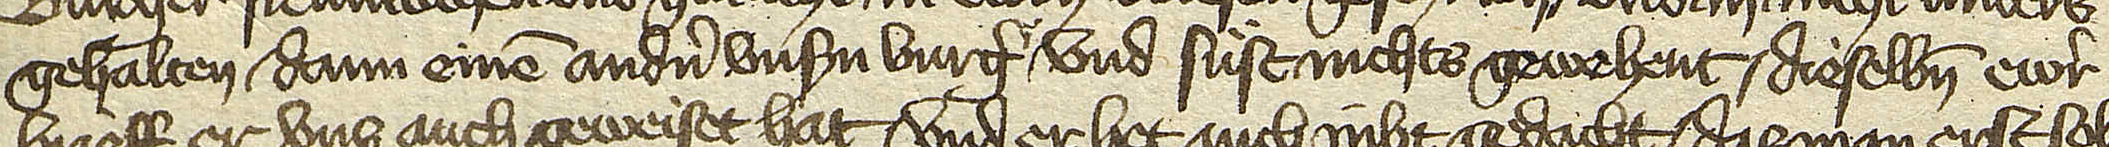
gehalten / dann eine* andn* vnſ*n burg* / vnd ſüſt nichts gewehent / dieſelbn* ew*r
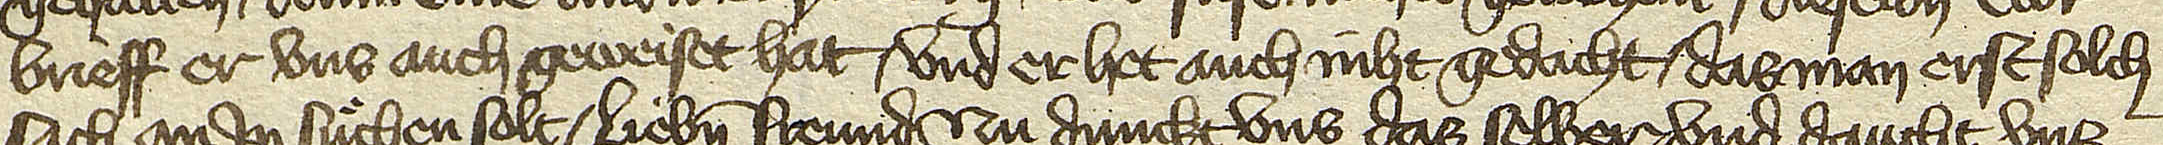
brieff er vns auch geweiſet hat / vnd er het auch niht gedacht / das man erſt ſolch
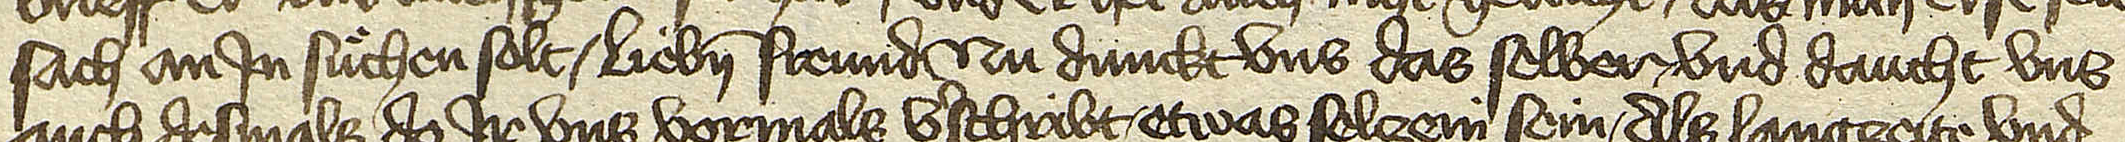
ſach an In ſüchen ſolt / Liebn* freund Nu dunkt vns das ſelber / vnd daucht vns
